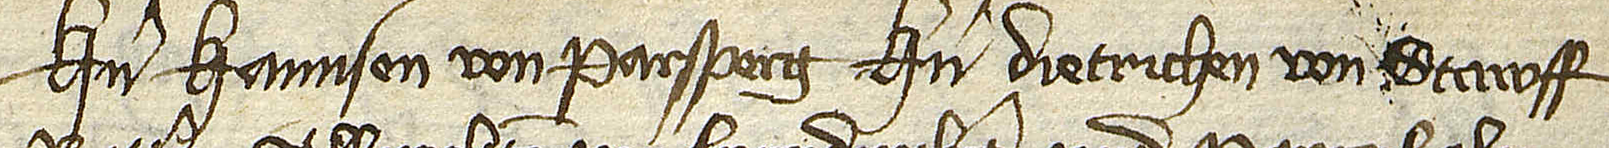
H*n Hannſen von Parſperg H*n dietrichen von Stawff
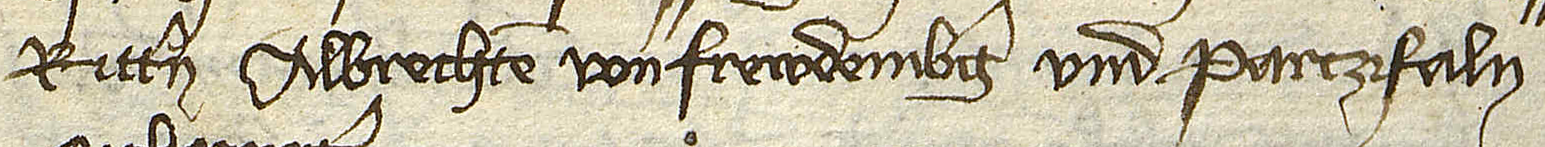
Ritt*n Albrechte* von frewdemb*g vnd Parcʒifaln
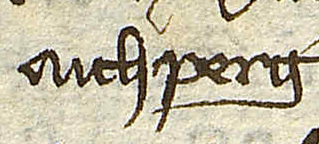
aichperg*
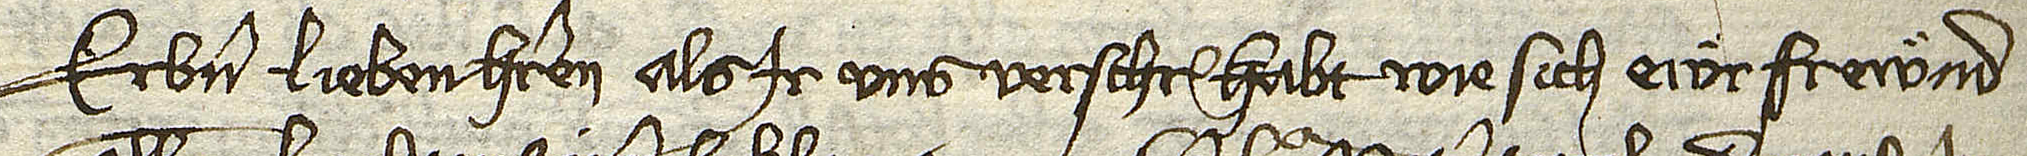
Erb*n lieben h*ren als Ir vns verſchr* habt wie ſich ewr frewnd
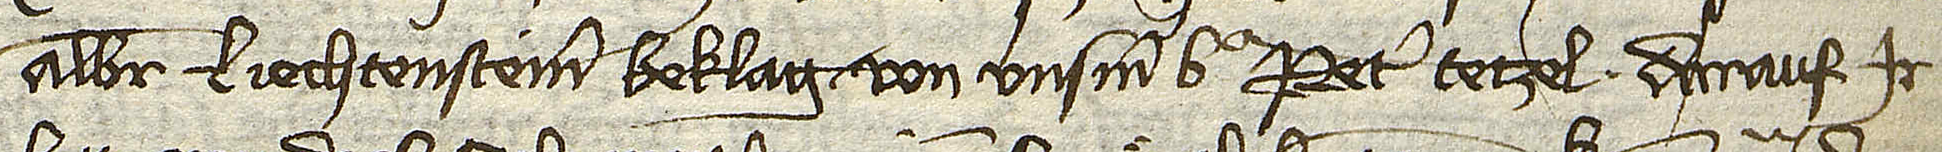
albr* liechtenſtein* beklag / von vnſ*m b* Pet* tecʒel . Darauf Ir
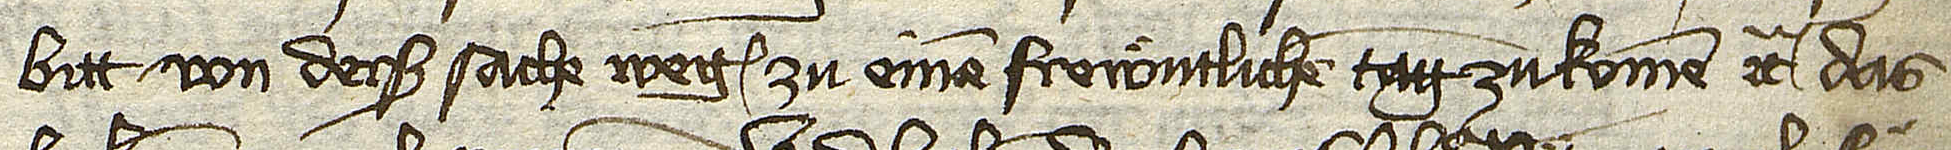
bitt / von derſ* ſache weg* ʒu eine* frewntliche* tag ʒu kome* ec* das
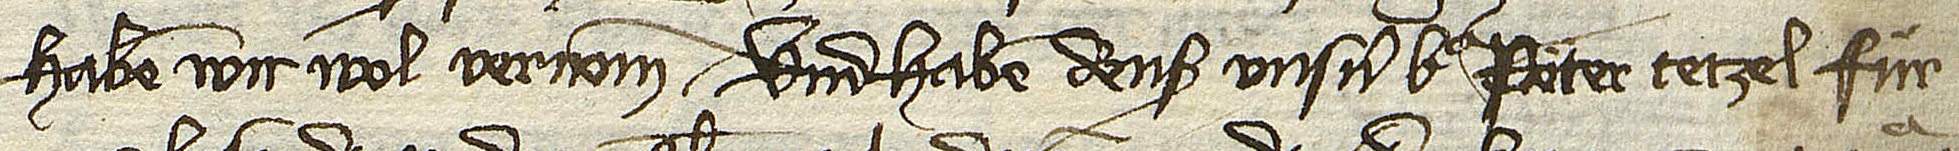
habe* wir wol vernom* / Vnd habe* denſ* vnſ*n b* Pëter tecʒel für
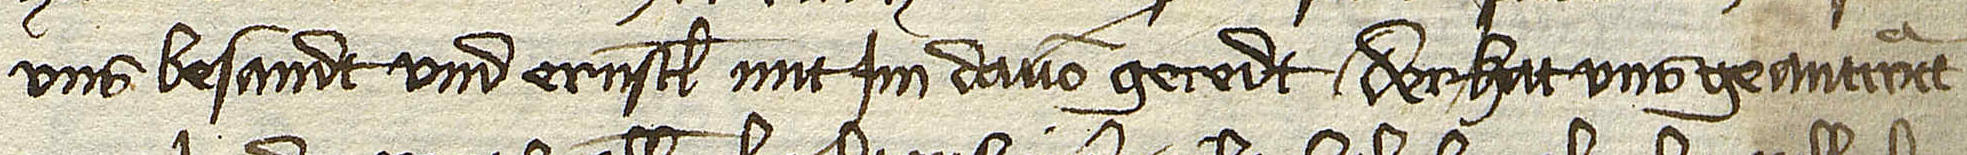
vns beſandt vnd ernſtl* mit Im dauo* geredt / der hat vns geantw*tt
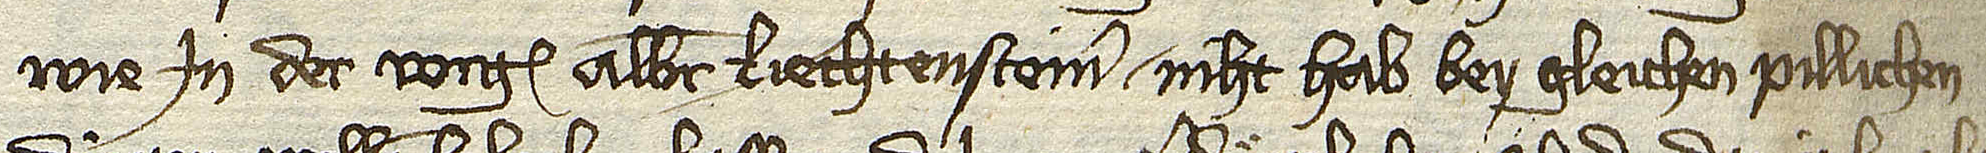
wie In der vorg* albr* liechtenſtein* / niht hab bey gleichen pillichen
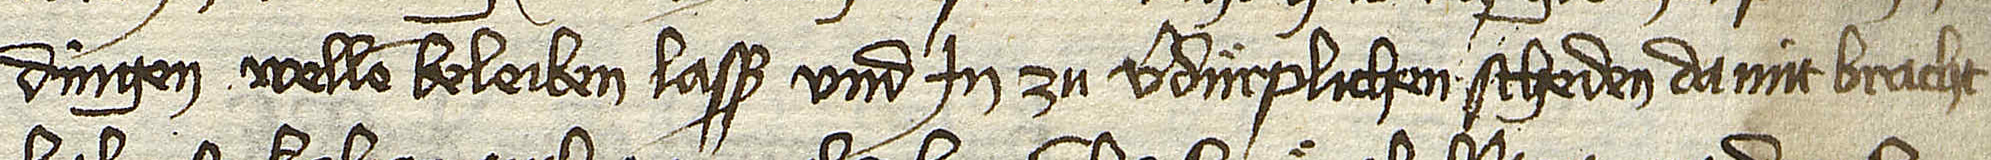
dingen welle* beleiben laſſ* vnd In ʒu v*dürplichen ſcheden da mit bracht
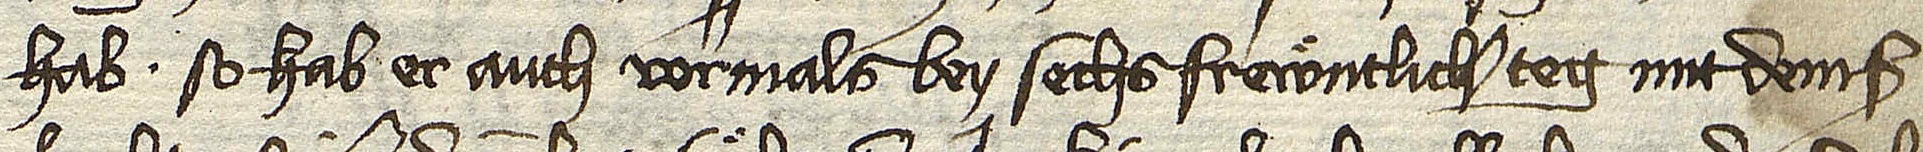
hab . ſo hab er auch vormals bey ſechs frewntlich* teg mit demſ*
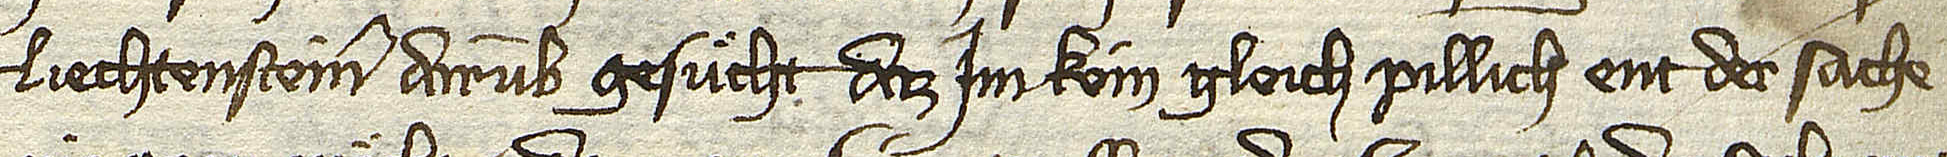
liechtenſtein* daru*b geſücht daʒ Im kein gleich pillich enc der ſache
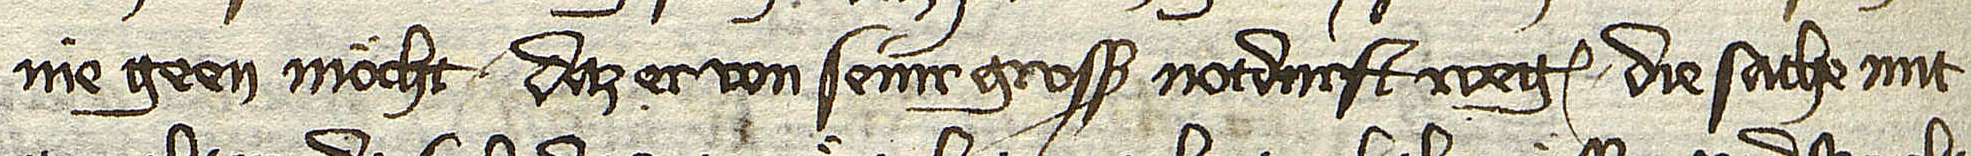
nie geen möcht / Daʒ er von ſeinr groſſ* notdurft weg* die ſache mit
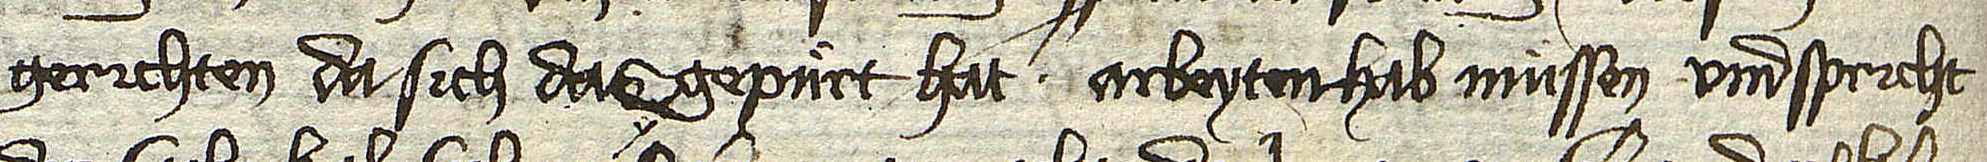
gerichten da ſich das gepürt hat . arbeyten hab müſſen vnd ſpricht
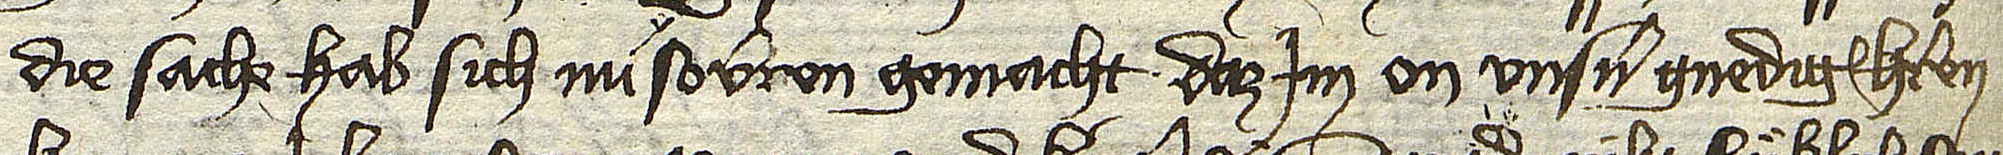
die ſache hab ſich nu ſov*ren gemacht . daʒ Im on vnſ*n gnedig* h*ren
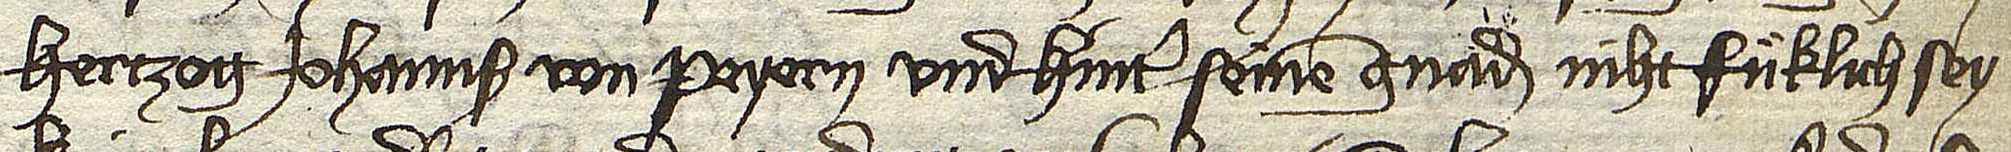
hercʒog Iohannſ* von Peyern vnd hint* ſeine gnad* niht füklich ſey
